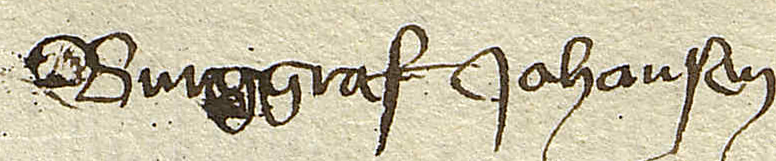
Burggraf Iohanſen
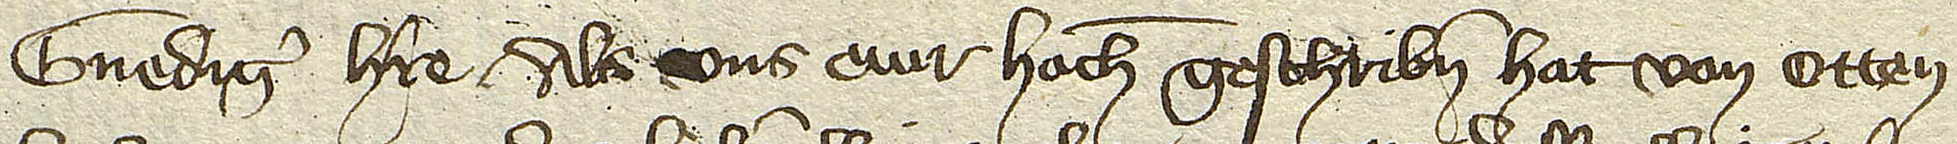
Gnedig* hr*e / Als vns ewr hoch* geſchribn* hat von Otten
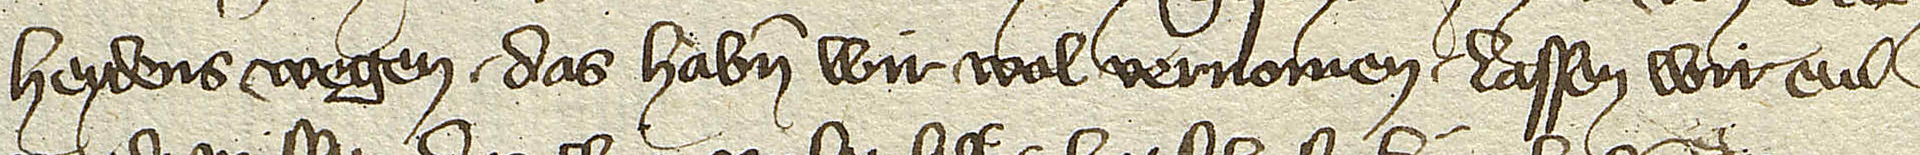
heydens wegen / das habn* wir wol vernomen / laſſen wir ew*
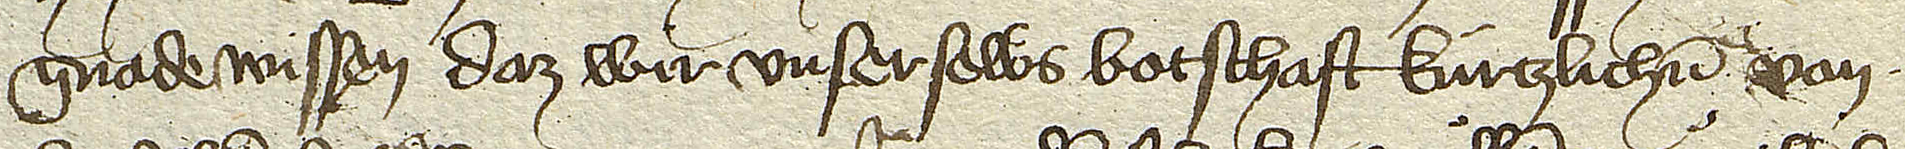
gnade wiſſen / daʒ wir vnſer ſelbs botſchaft kürcʒlichn* von
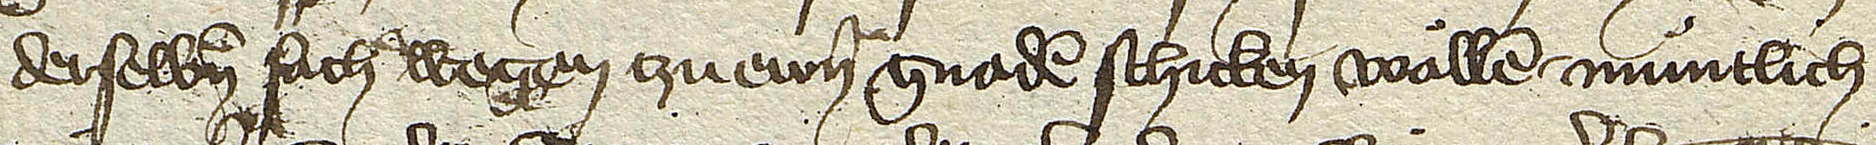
derſelbn* ſach wegen cʒu ewn* gnad* ſchicken wölle* / müntlich
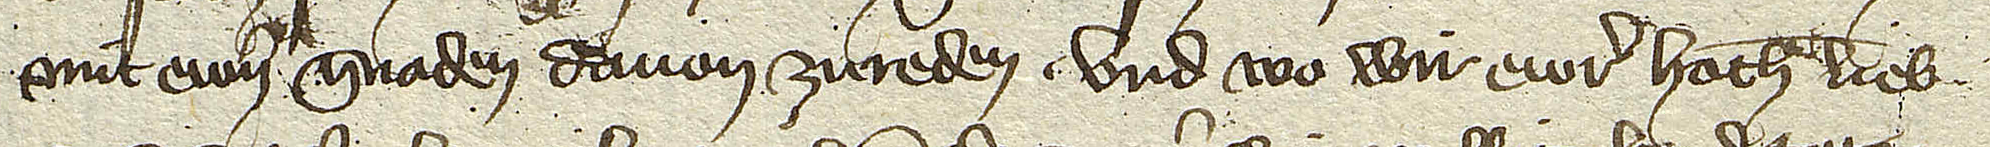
mit ewn* gnaden dauon cʒureden / vnd wo wir ewr* hoch* lieb
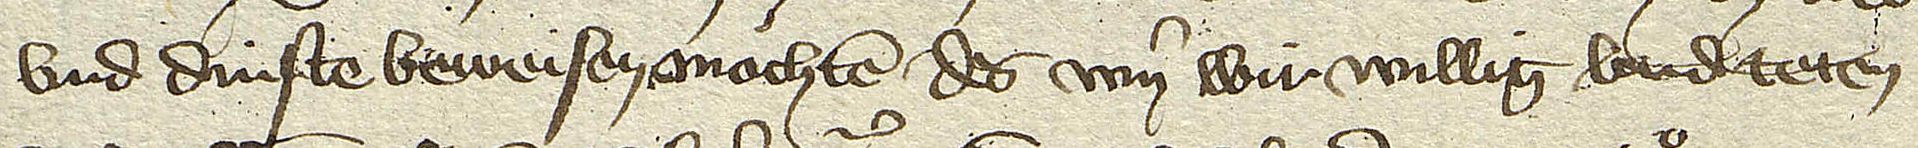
vnd dinſte beweiſen mochte* / des w*n wir willig vnd teten
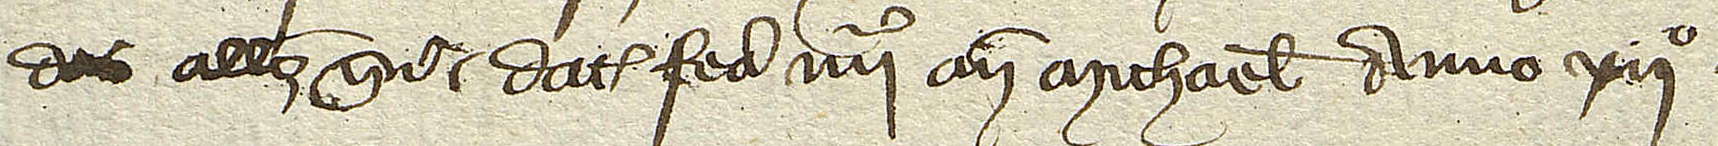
das allcʒ* gn* / dat* fea* iiii* an* Michael* Anno xii* /
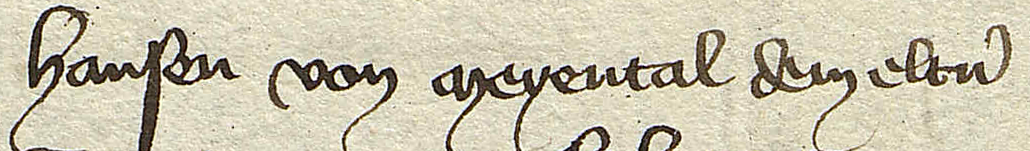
Hanſen von Meyental dem eltn*
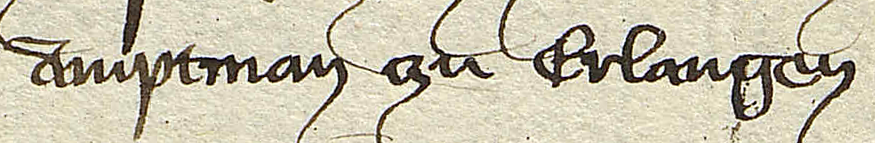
Amptman cʒu Erlangen
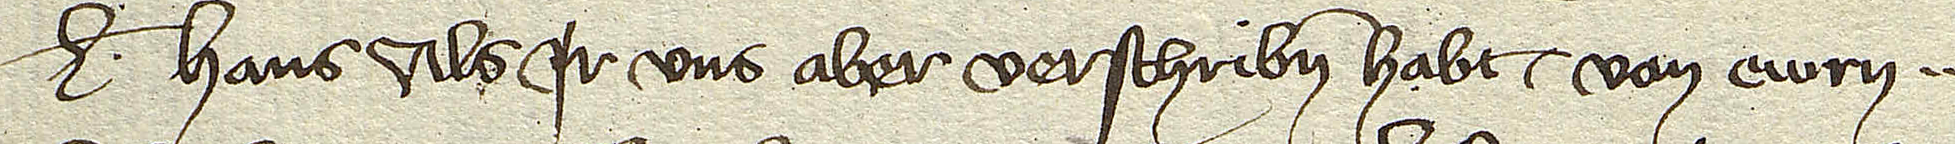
L* . hans Als Ir vns aber verſchribn* habt / von ewrn ~
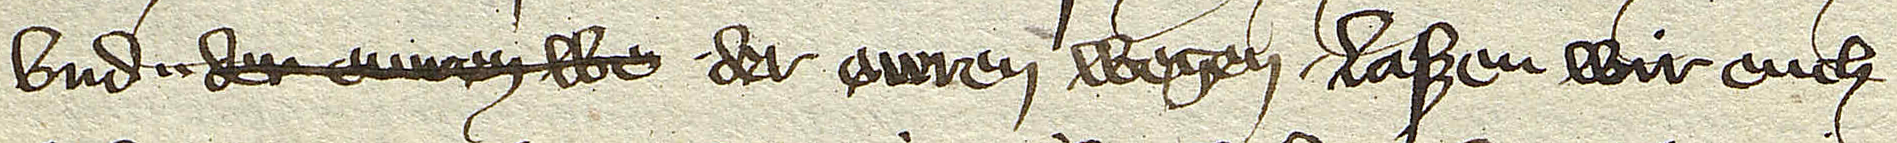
vnd ~ der ewren we der ewren wegen / laſʒen wir euch
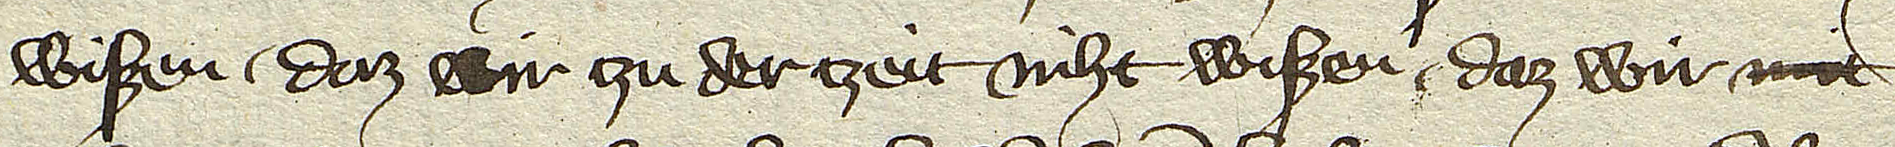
wiſʒen / daʒ wir cʒu der cʒeit niht wiſʒen / daʒ wir mit
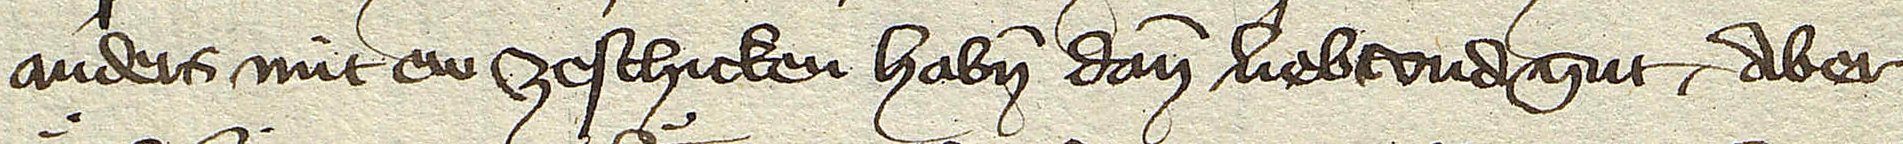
anders mit ew cʒeſchicken habn* dan* lieb vnd gut / Aber
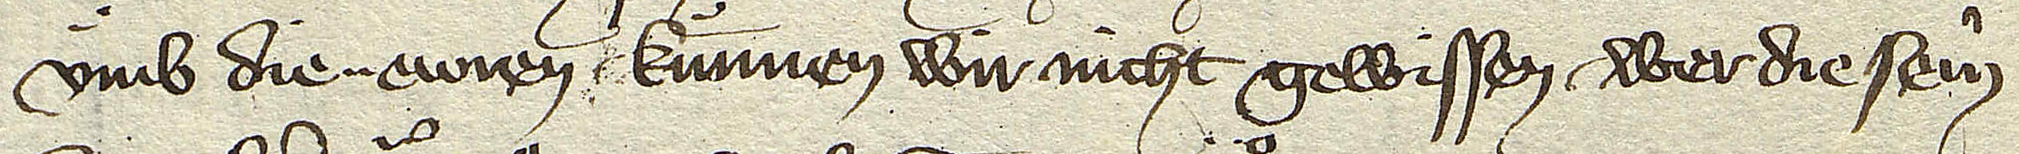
v̈mb die ~ ewren / künnen wir nicht gewiſſen / wer die ſein
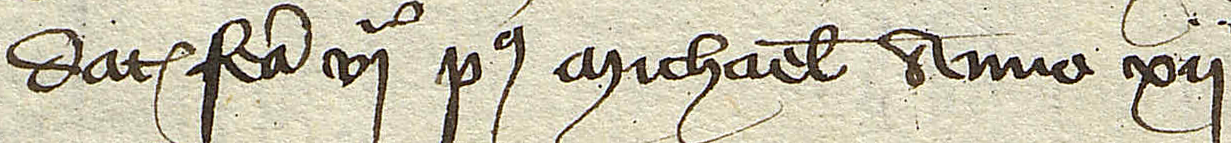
dat* fea* vi* p* Michael* Anno xii*
